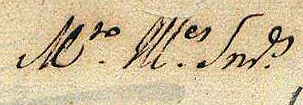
M.to Ill.es Snr.es
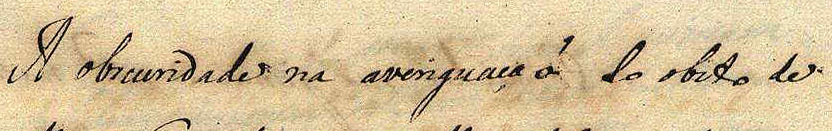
A obscuridade na averiguaçaõ do obito de
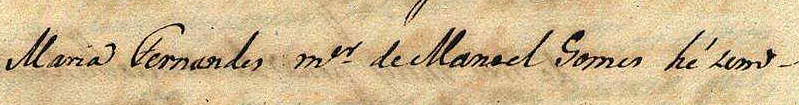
Maria Fernandes m.er de Manoel Gomes hé sem
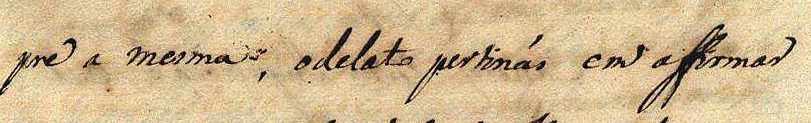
pre a mesma, o delato pertinás em affirmar
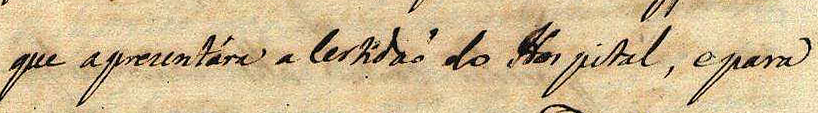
que aprezentára a Certidaõ do Hospital, e para
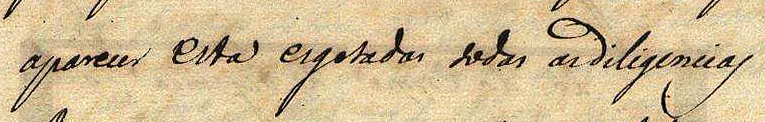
aparecer esta esgotadas todas as diligencias
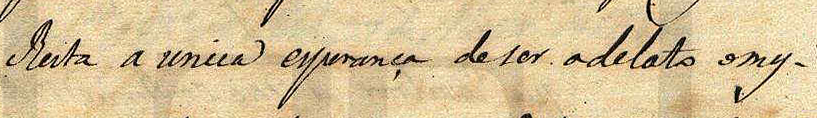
Resta a unica esperança de ser o delato o mes
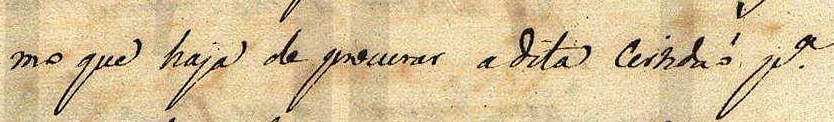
mo que haja de procurar a dita Certidaõ p.a
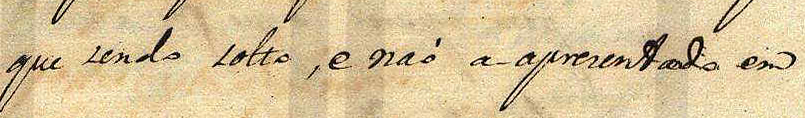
que sendo solto, e naõ a aprezentando em
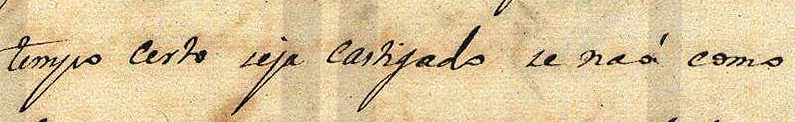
tempo certo seja castigado se naõ como
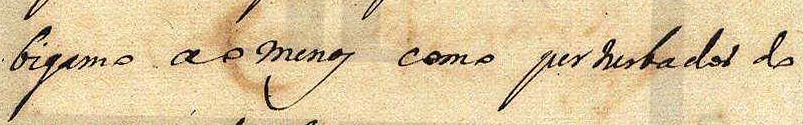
bigamo ao menos como perturbador do
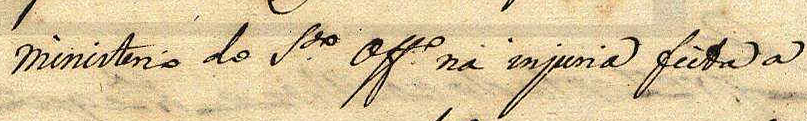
ministerio do S.to Off.o na injuria feita a
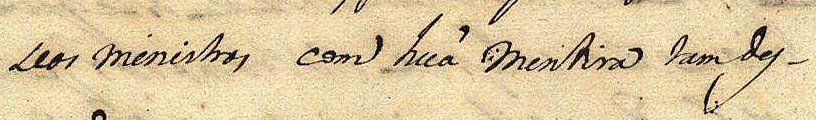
seos ministros com huā mentira tam des
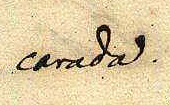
carada.
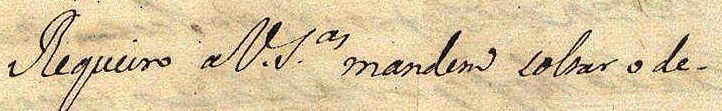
Requeiro a V. S.as mandem soltar o de
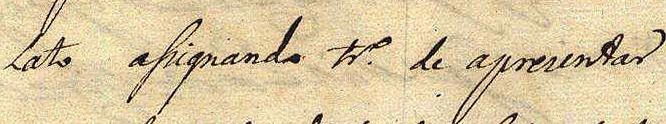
lato assignando tr.o de aprezentar
